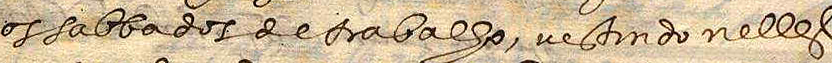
os sabbados de trabalho, uestindo nelles
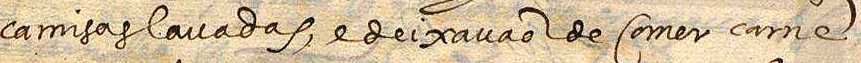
camisas lauadas, e deixauaõ de Comer carne
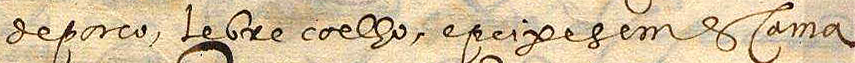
de porco, Lebre coelho, e peixe sem esCama
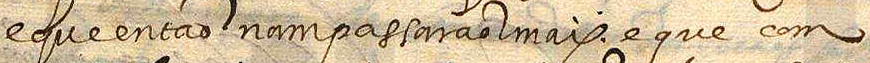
e que então nam passaraõ mais e que com
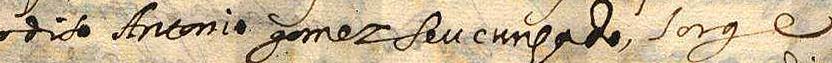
o dito Antonio gomez seu cunhado, Iorge
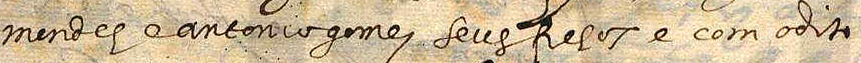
mendes e antonio gomez seus filhos e com o dito
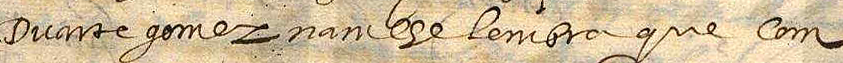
Duarte gomez nam lhe lembra que com
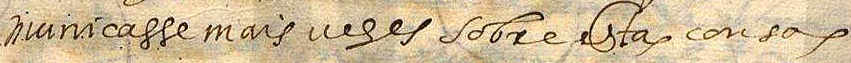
municasse mais uezes sobre estas cousas
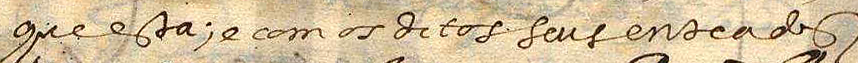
que esta; e com os ditos seus enteados
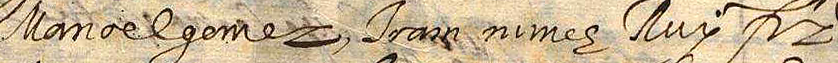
Manoel gomez, Ioam nunez Ruy fr̄z
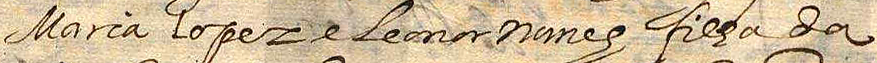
Maria Lopez e Leonor nunez filha da
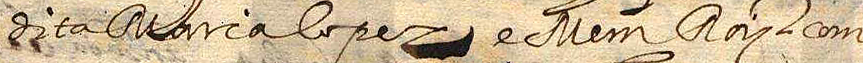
dita Maria lopez e Mem Roīz com
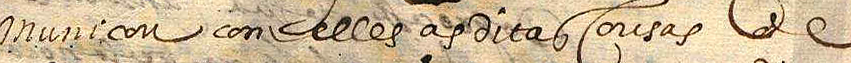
municou com elles as ditas Cousas de
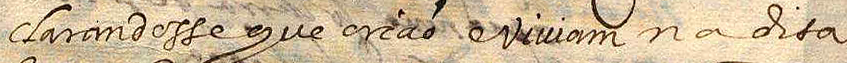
clarandosse que criaõ e viuiam na dita
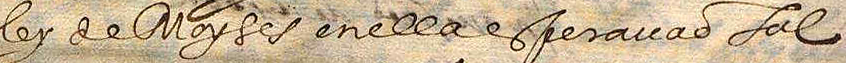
ley de Moyses e nella esperauaõ sal
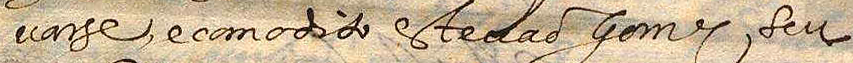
uarse, e com o dito esteuaõ gomez seu
